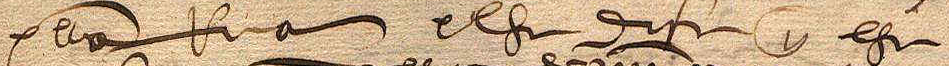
pl̄la Rua e lhe dise q̄ lhe
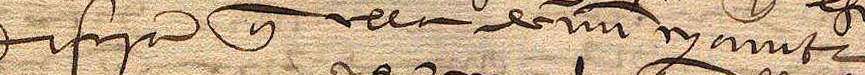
diserā q̄ ella denūcyamte
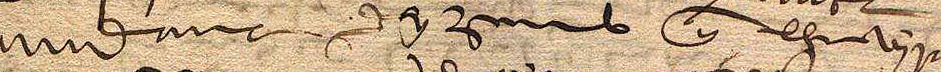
andaua dyzendo q̄ lhe vyra
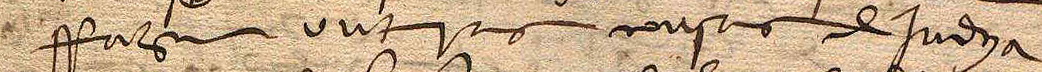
ffazer outras cousas de Judya
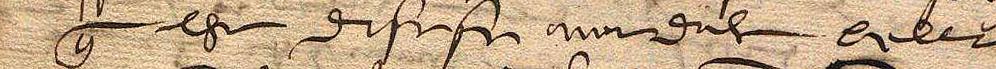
q̄ lhe disese a uerdade e ella
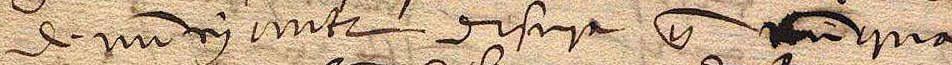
denūcyante disera q̄ nūqua
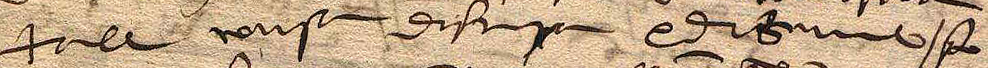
tall cousa disera e dizendo Jsto
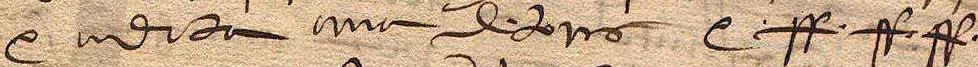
e a dita ana de tores e .ff. ff. ff.
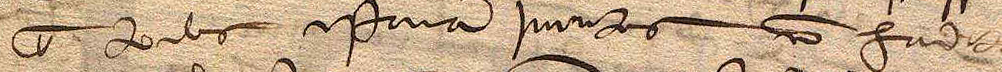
q̄ todos estauā Jumtos c̄o ha dita
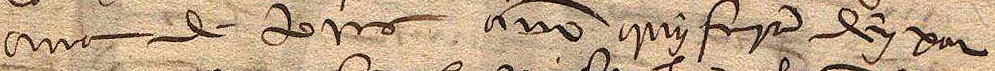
ana de tores a n̄o quyserā deyxar
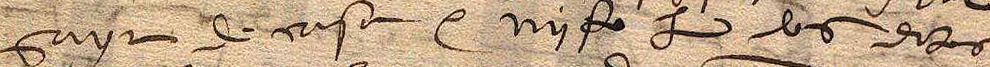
sayr de casa e nysto hū dos ditos
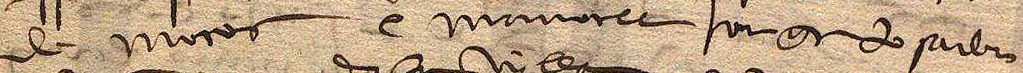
de mocos e manoell Jorge tosador
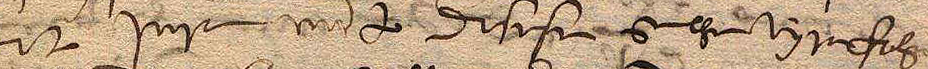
dito Juramēto disese se lhe vyra fazer
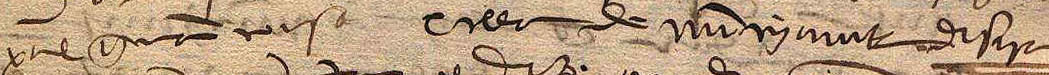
alguā cousa e ella denūcyamte disera
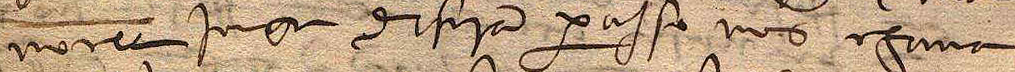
noell Jorge diserā ꝑa Jso nos chama
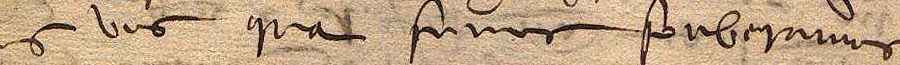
ves vos qua se nos souberamos
